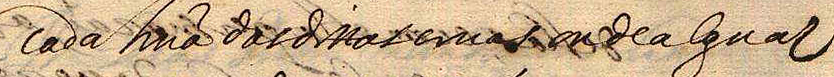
cada huā das dittas eruas ou de alguā
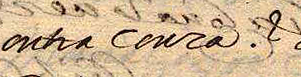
outra couza?
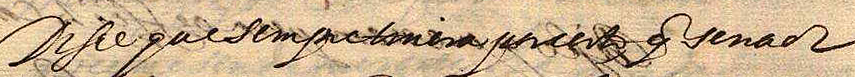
Disse que sempre tiuera por certo q̄ se naõ
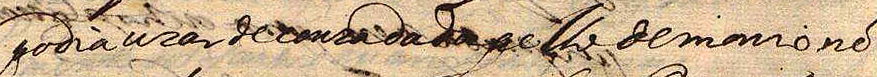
podia uzar de couza dada pello demonio, nē
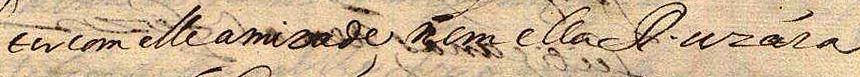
ter com elle amizade, nem ella R. uzara
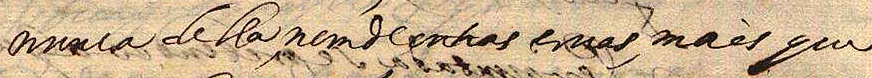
nunca della, nem de outras eruas, mais que
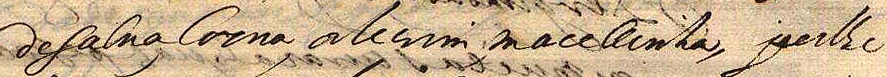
de salua, lozna, alecrim, macellinha, per lhe
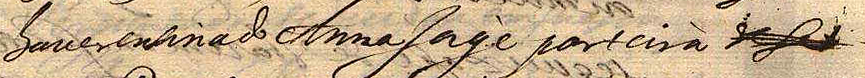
hauer ensinado Anna Jorge parteira de se
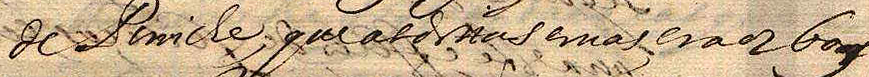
de Peniche, que as dittas eruas eraõ boas
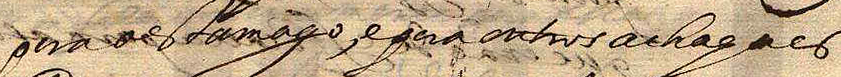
pera o estamago, e pera outros achaques
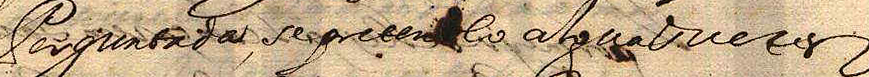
Perguntada, se pretendeo alguās uezes
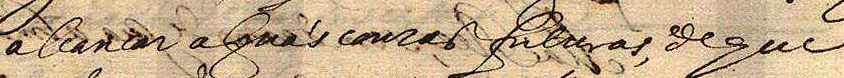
alcançar allguas̄ couzas futuras, e de que
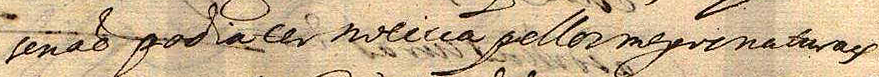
se naõ podia ter noticia pellos meyos naturaes
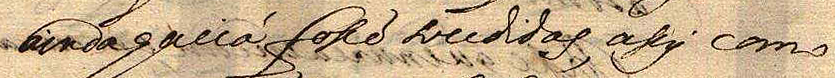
ainda que cá fossē socedidas, assy como
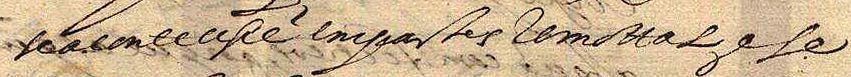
se acontecessē em partes Remottas, e se
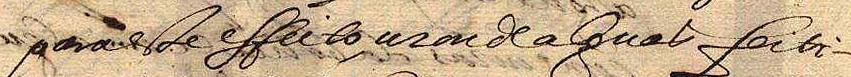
para este effeito uzou de alguās feiti
